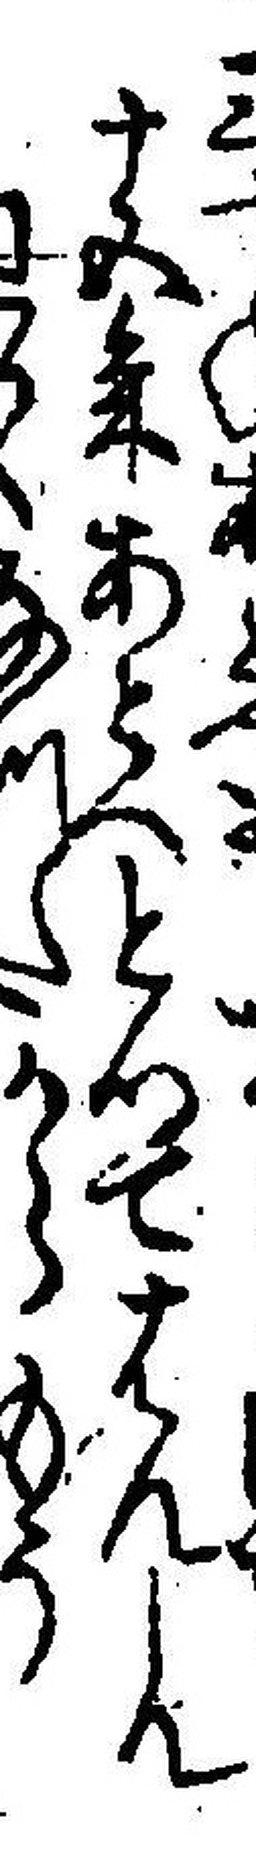十五年あとへとつてはんしん
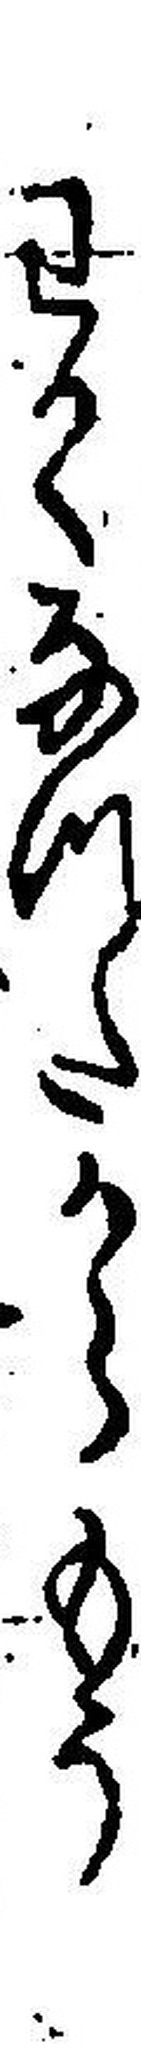わかくなつたからもう
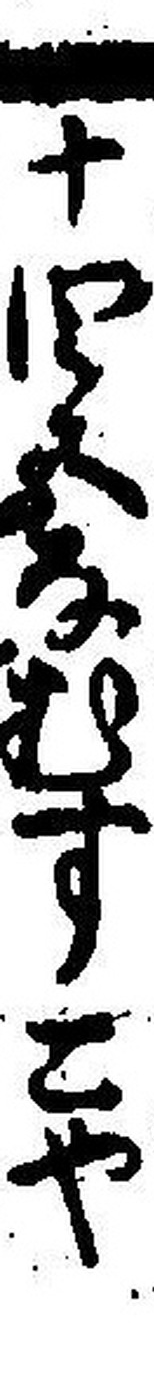十四五なむすこや
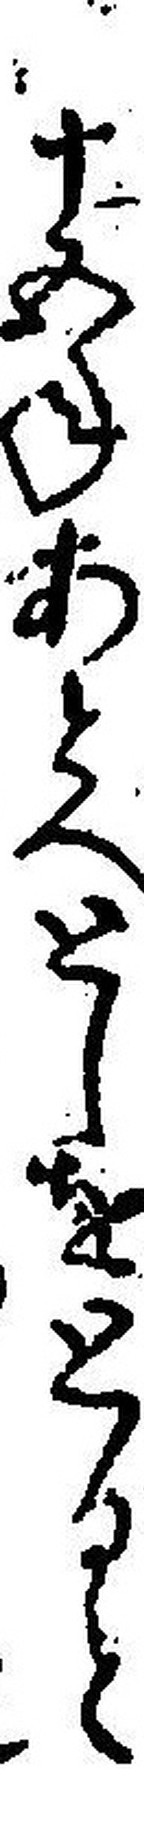十五年あとへとしをとると
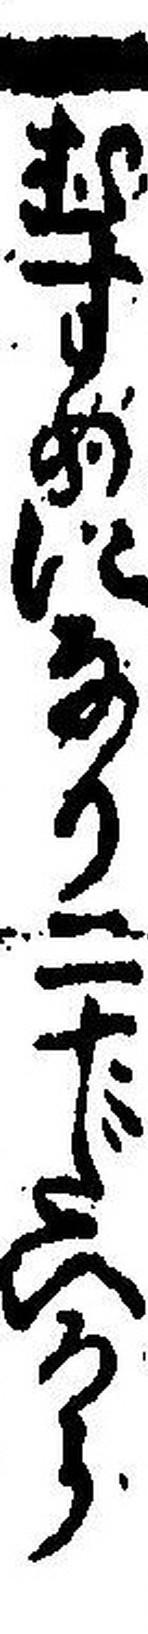むすめになり二十だいから
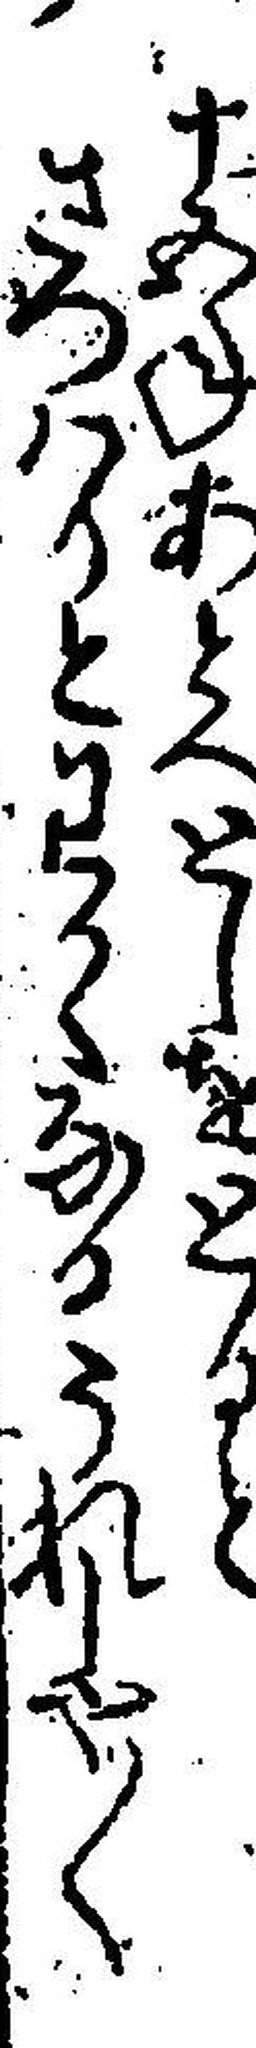さつはりとわかくなるうれしや〳〵
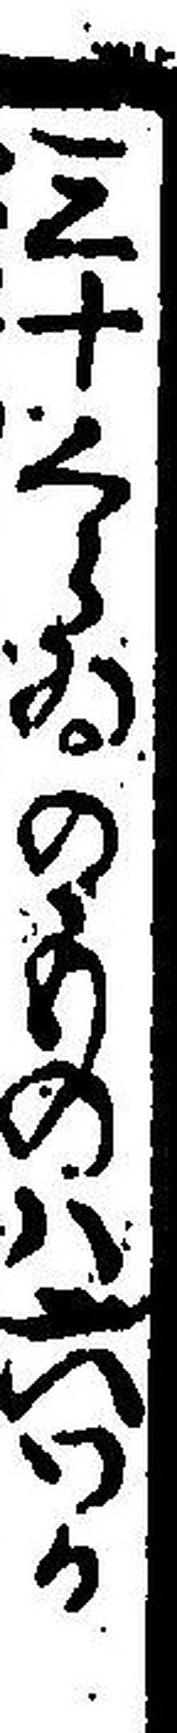三十くらゐのものは六つか
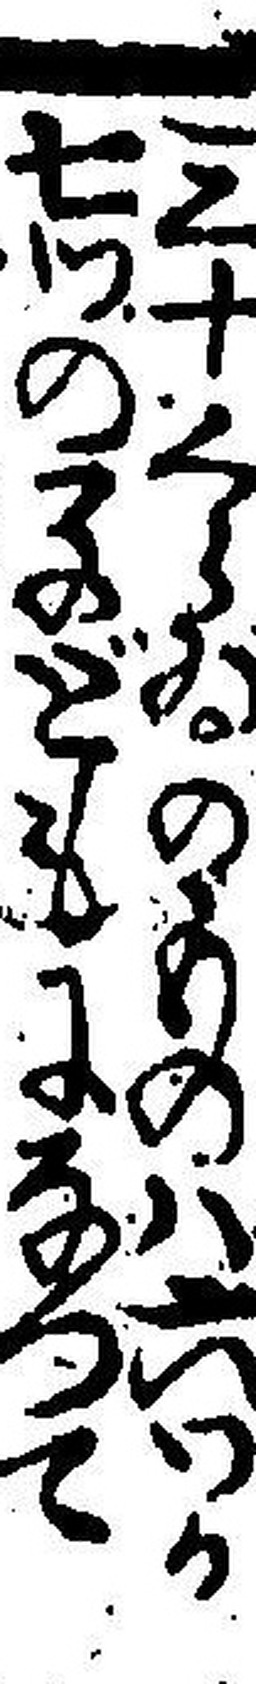七つの子どもになつて
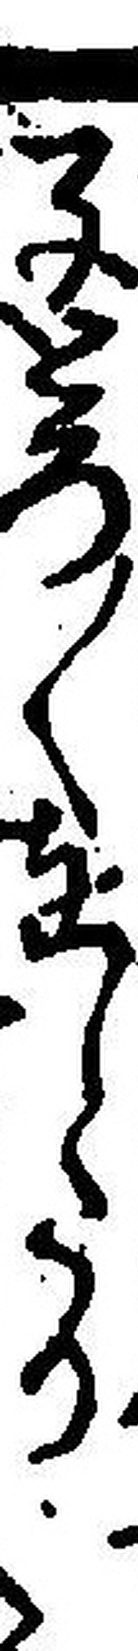子とろ〳〵をしたり
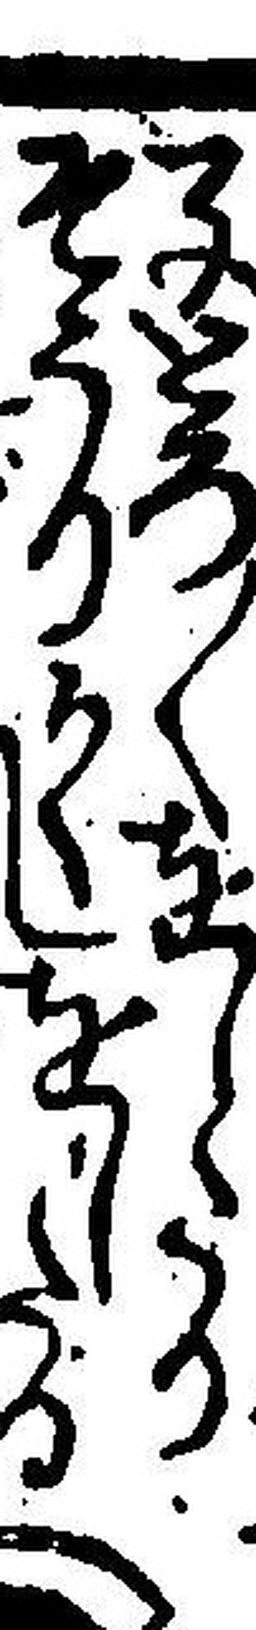そうりかくしをしたる
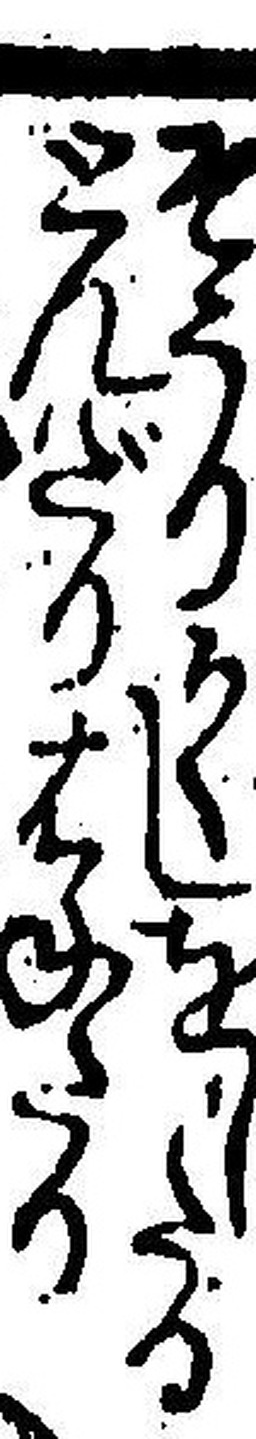とんだりはねたり
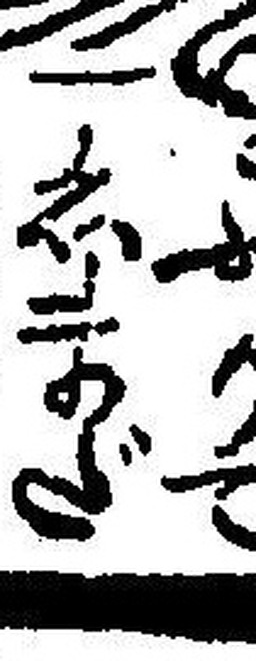しまだ
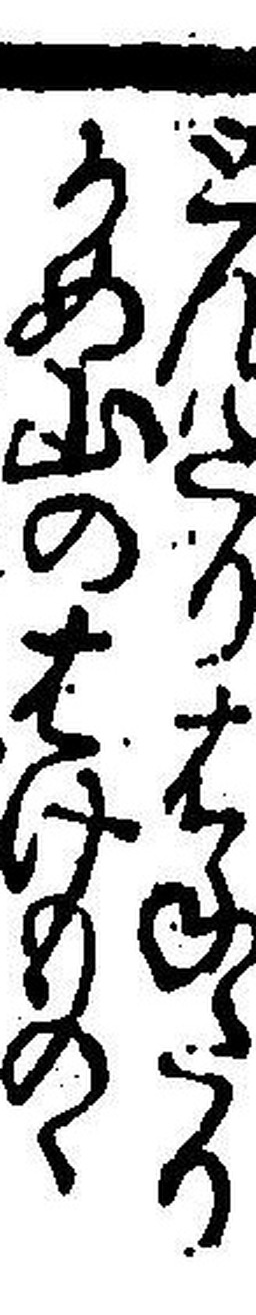かめ山のはけものゝ
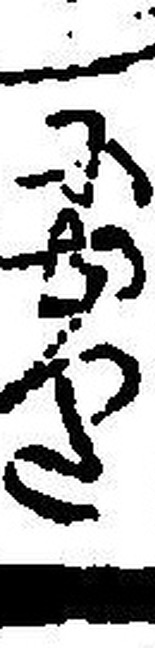にゆつた
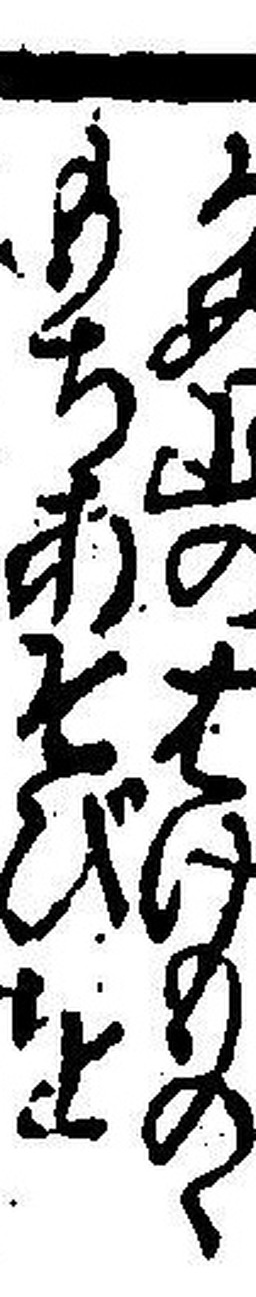もちあそびを
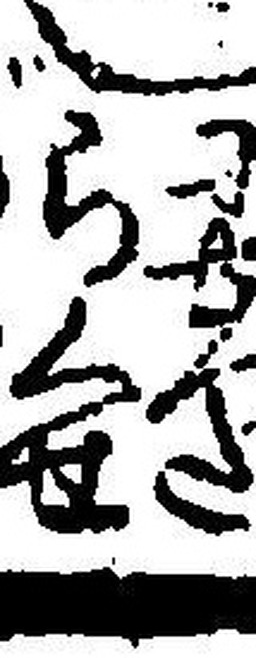らくせ
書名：徳若水縁起金性 / 樹下石上作
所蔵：東京大学総合図書館 General Library in the University of Tokyo, JAPAN
